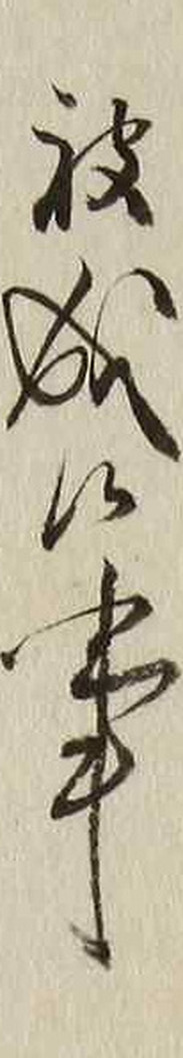被成候事
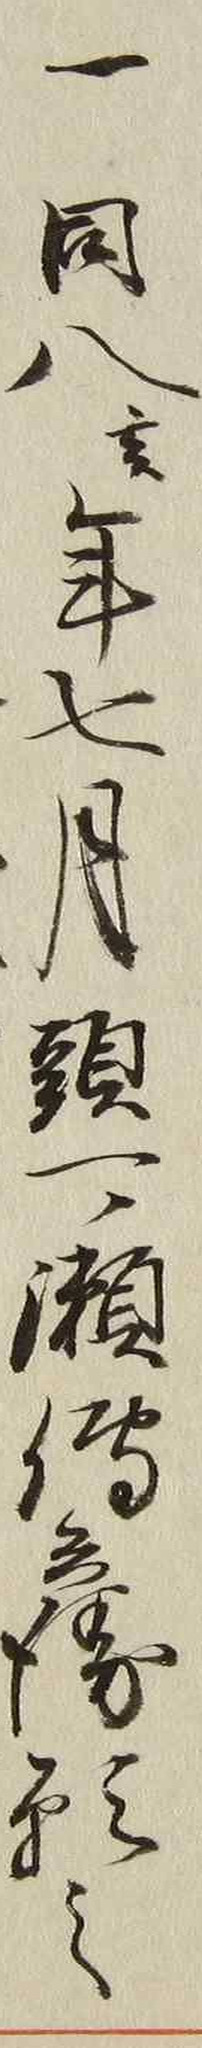一同八亥年七月頭一ノ瀬伝兵衛願之
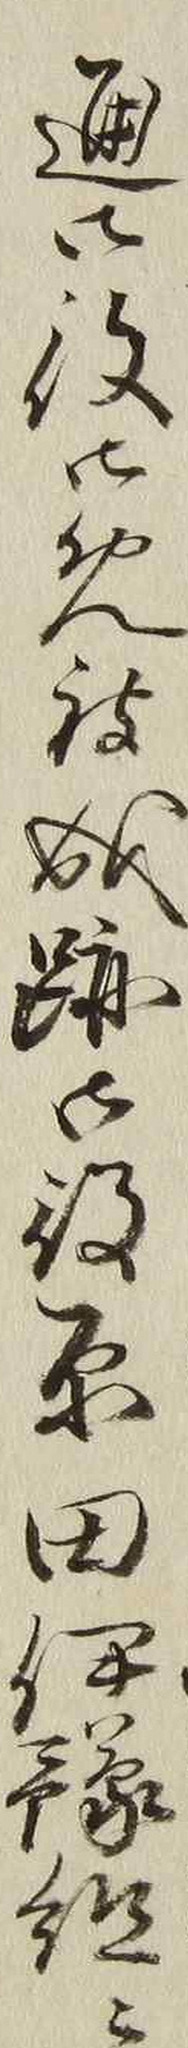通御役御免被成跡御役原田伊予組に
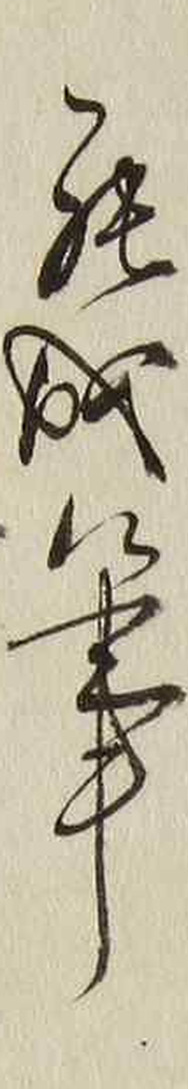罷成候事
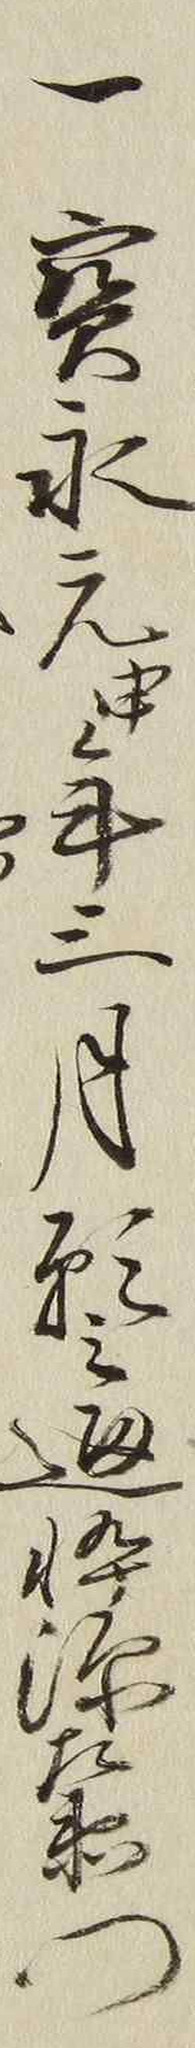一宝永元申年三月願之通悴源左衛門
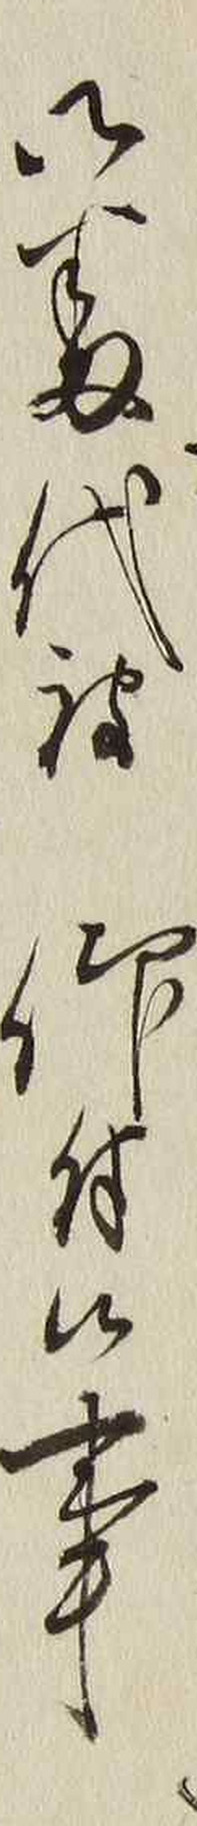御番代被仰付候事
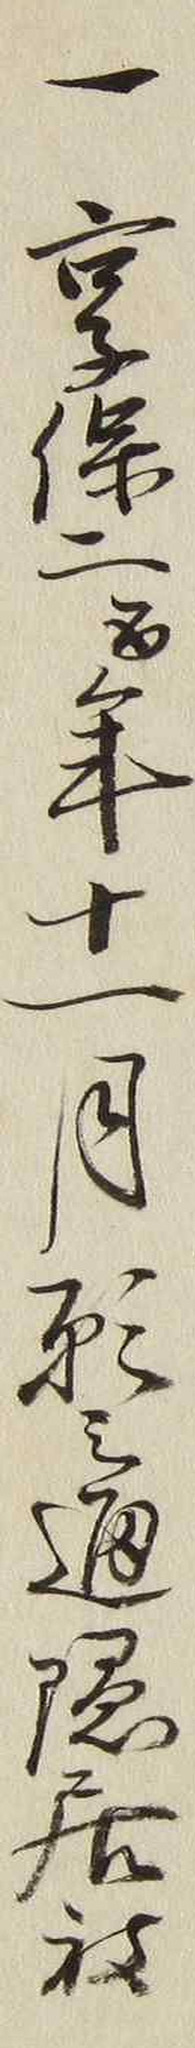一享保二酉年十一月願之通隠居被
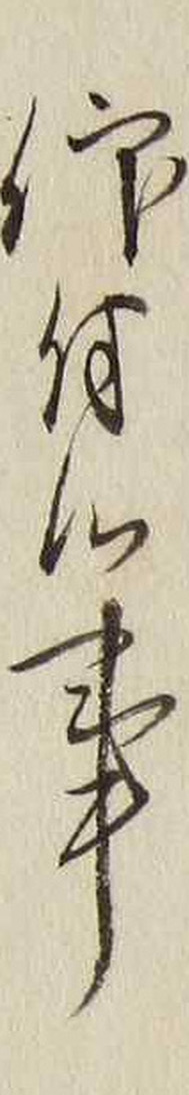仰付候事
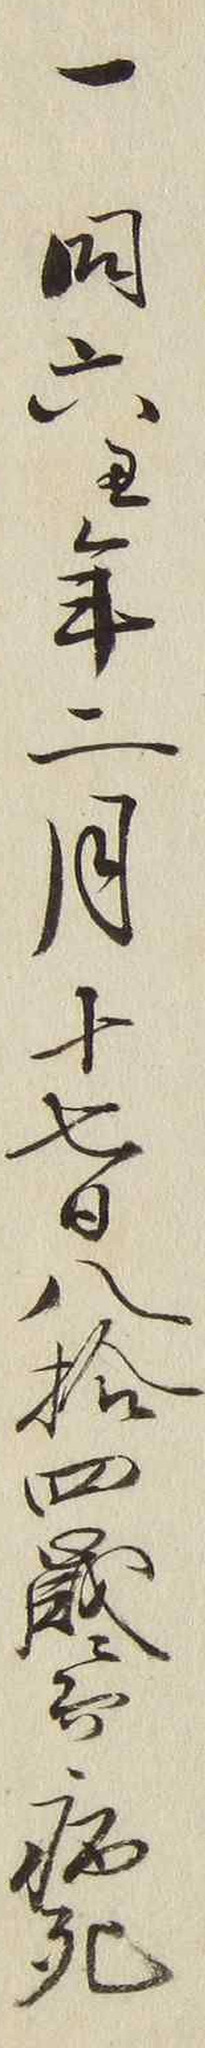一同六丑年二月十七日八拾四歳に而病死

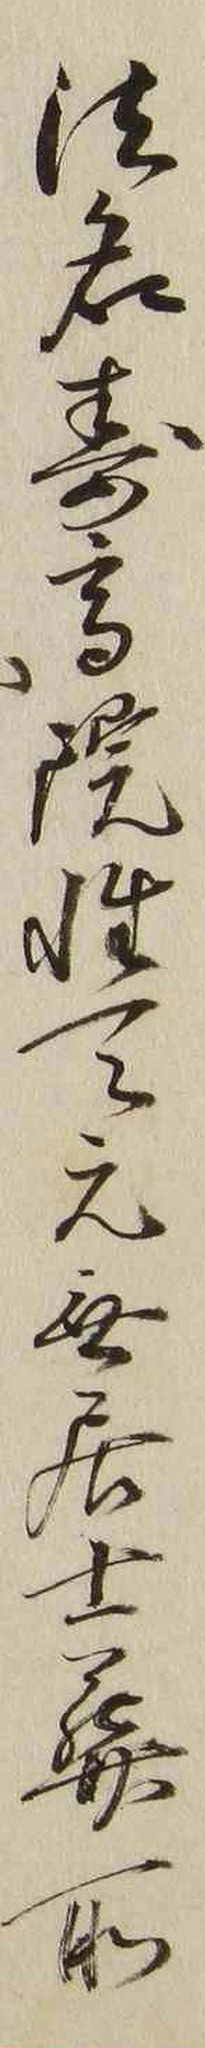法名寿高院性天元無居士葬所
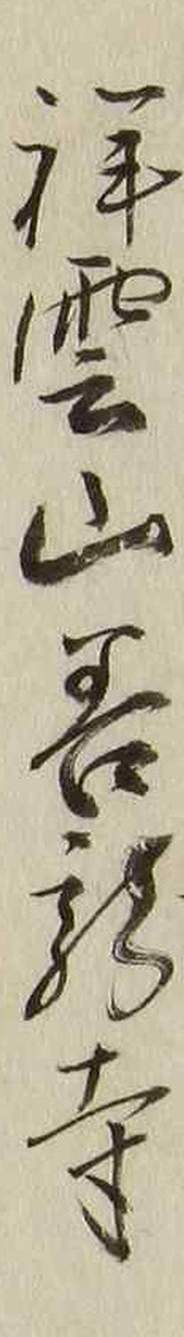祥雲山善竜寺
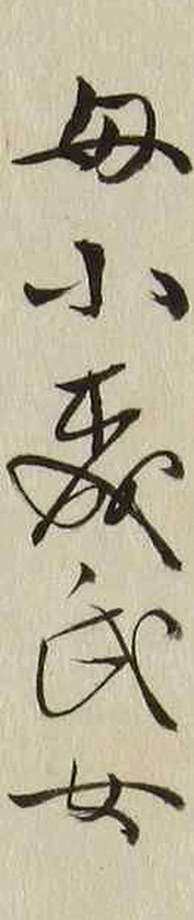母小森氏女
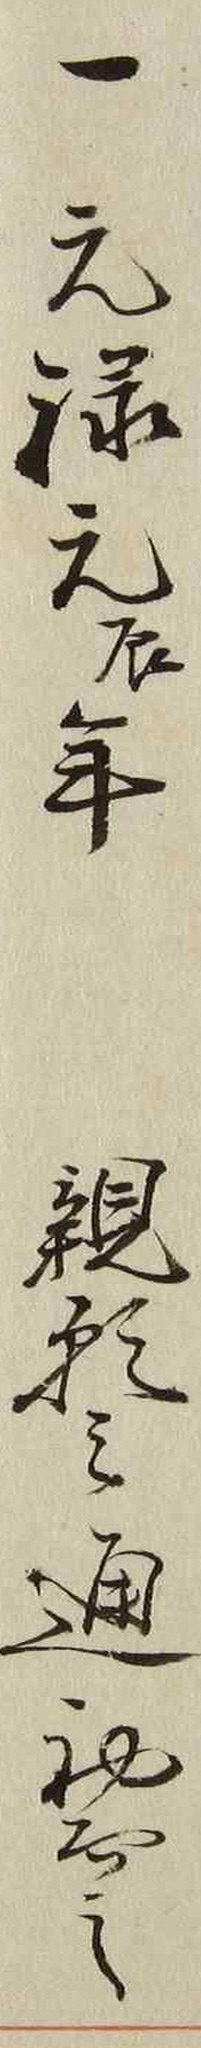一元禄元辰年親願之通初而之
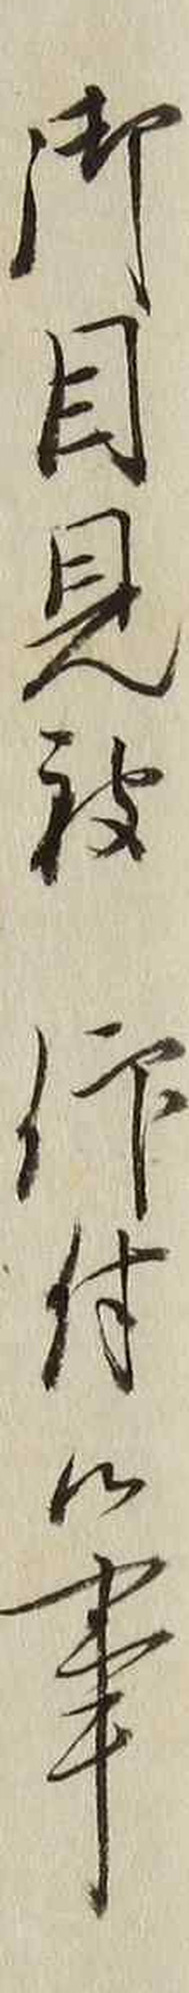御目見被仰付候事
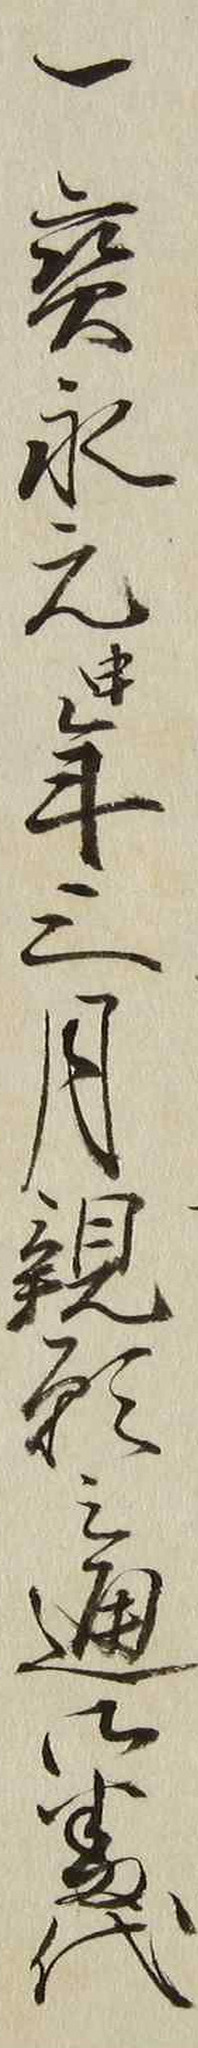一宝永元申年三月親願之通御番代
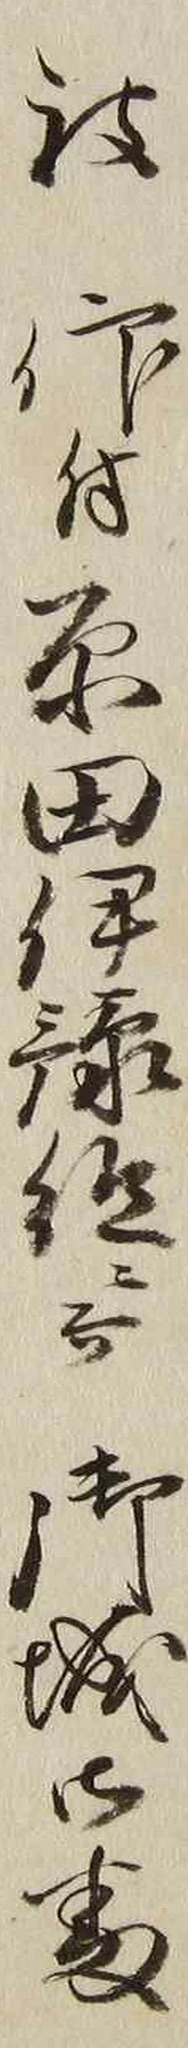被仰付原田伊予組に而御城御番
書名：諸士系譜　巻之157　ね之部1
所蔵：会津若松市立会津図書館
